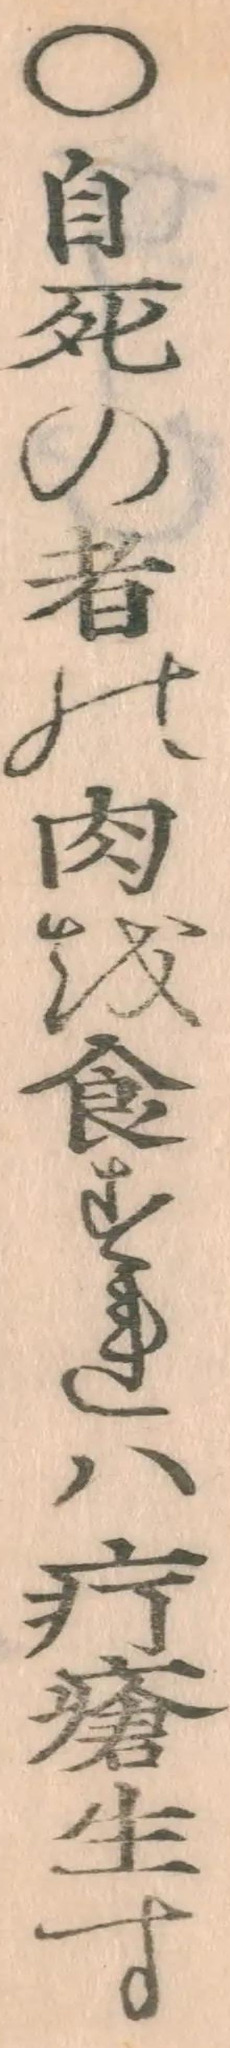〇自死の者の肉を食すれは疔瘡生す
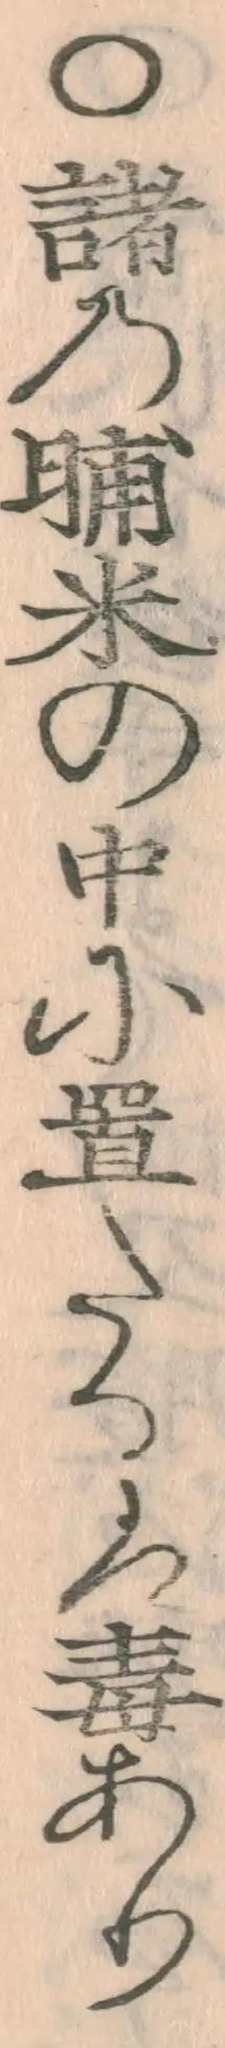〇諸の脯米の中に置たるは毒あり
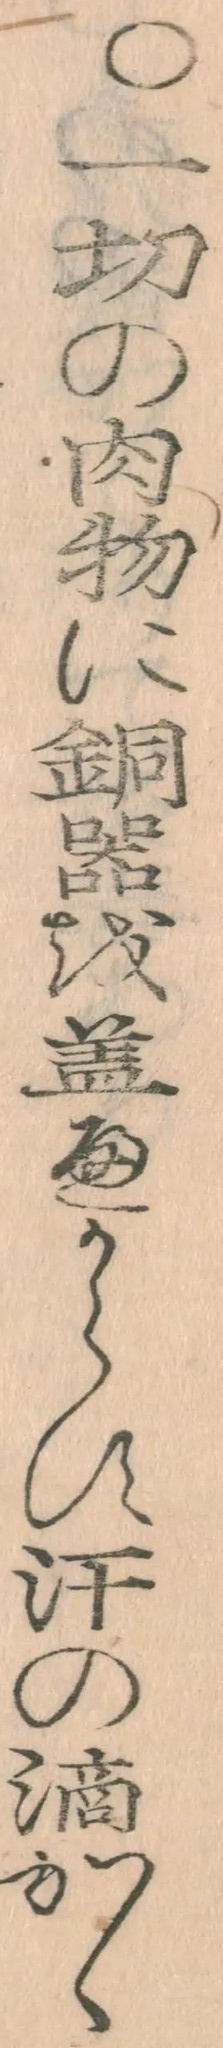〇一切の肉物に銅器を蓋へからす汗の滴かゝ
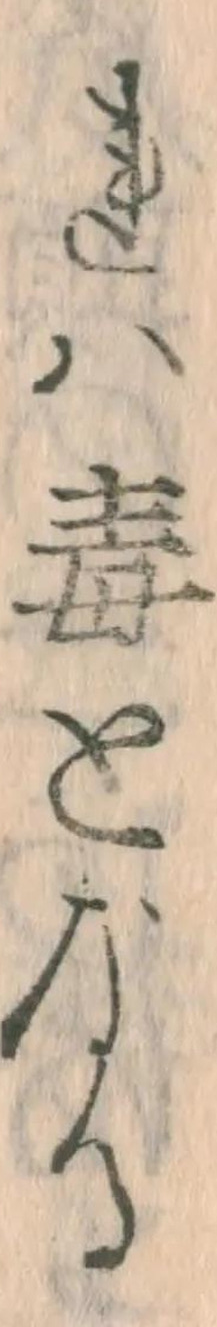れは毒となる
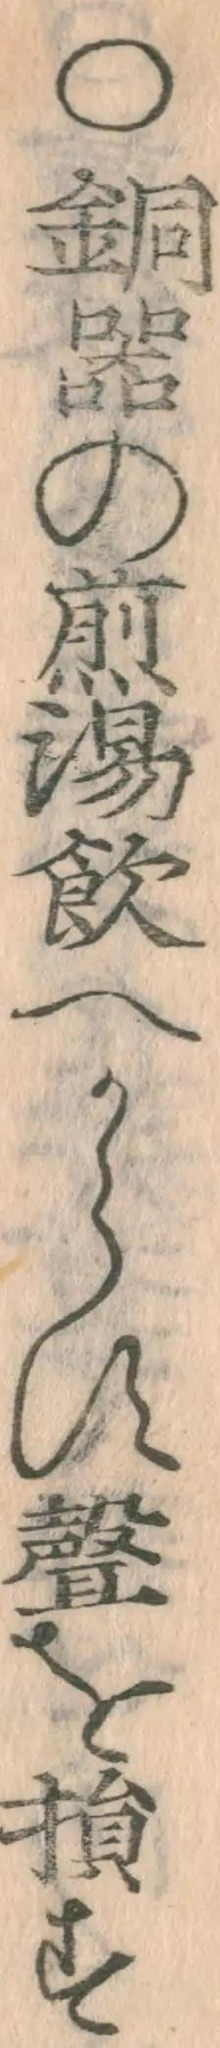〇銅器の煎湯飲へからす声を損す
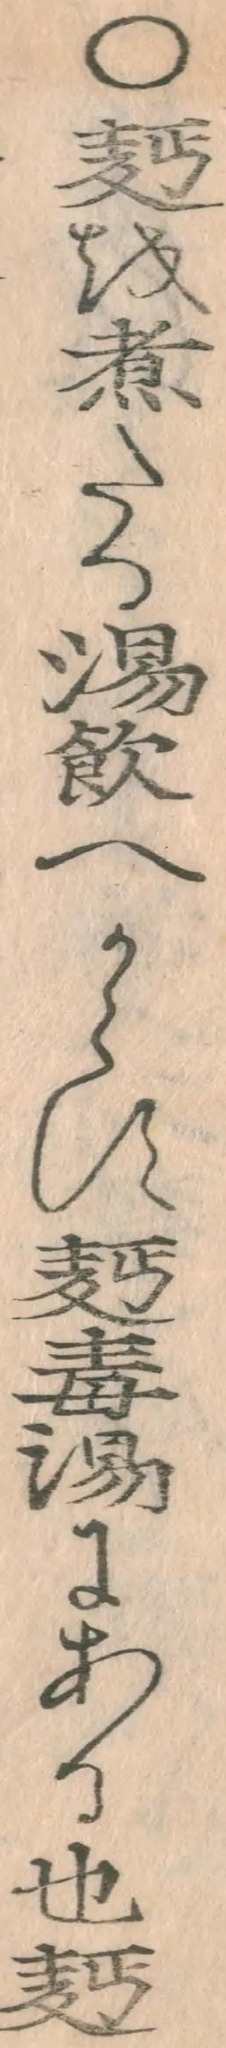〇麺を煮たる湯飲へからす麺毒湯にある也麺
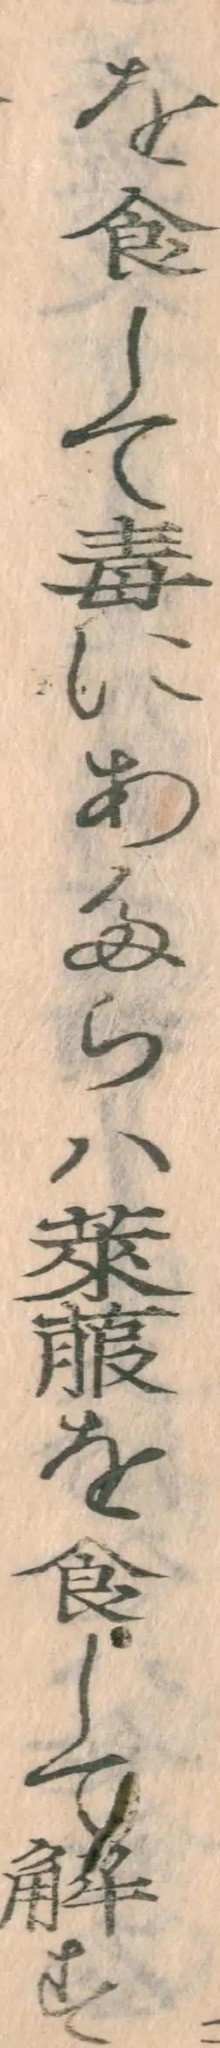を食して毒にあたらは萊菔を食して解す
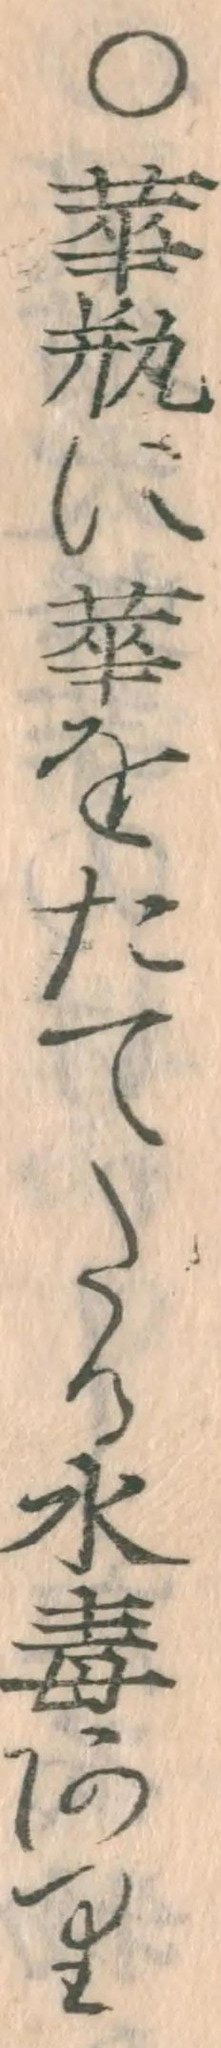〇華瓶に華をたてたる水毒あり
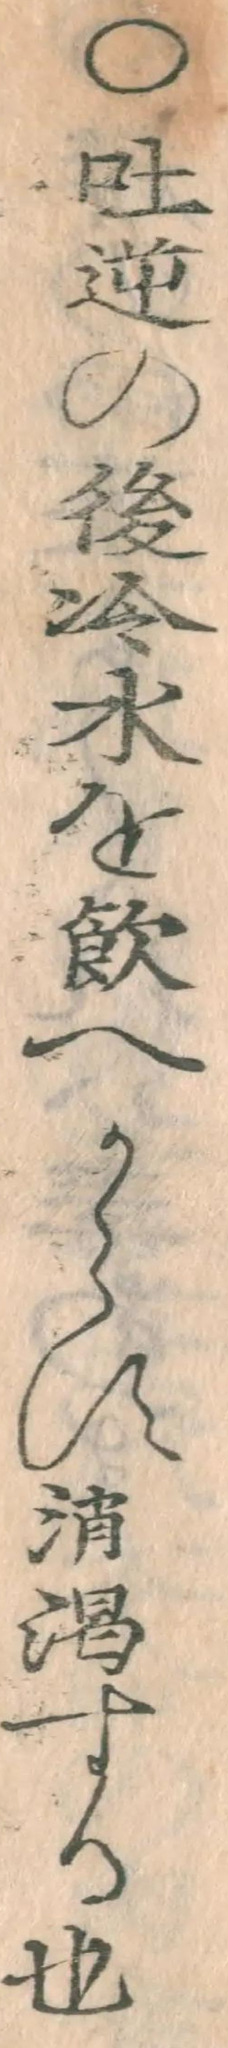〇吐逆の後冷水を飲へからす消渇する也
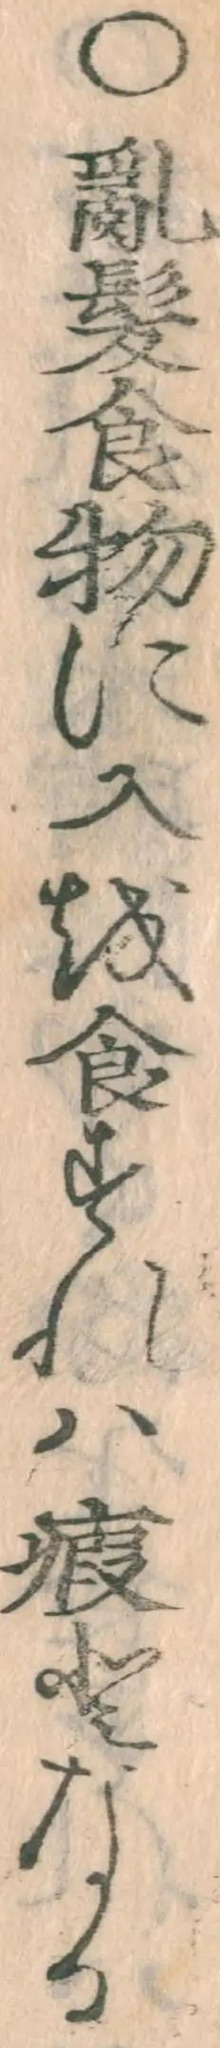〇乱髪食物に入を食すれは瘕となる

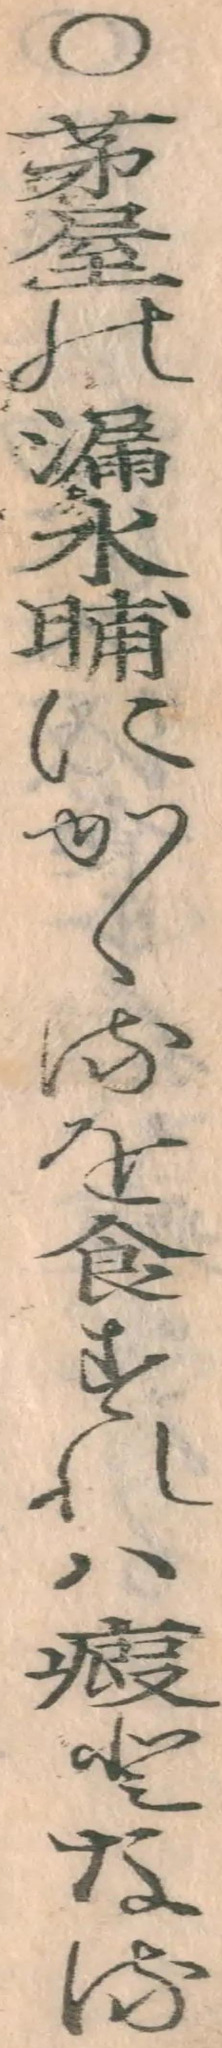〇茅屋の漏水脯にかゝるを食すれは瘕となる
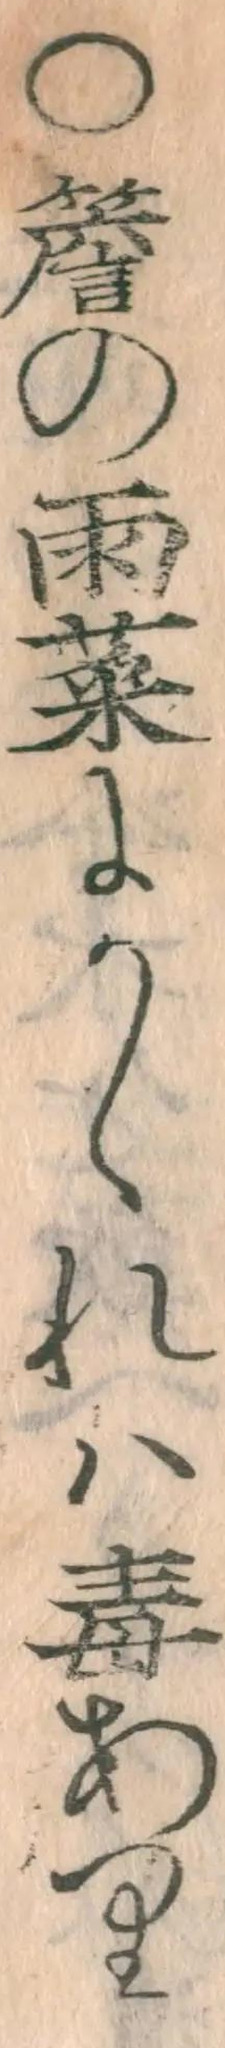〇簷の雨萊にかゝれは毒あり
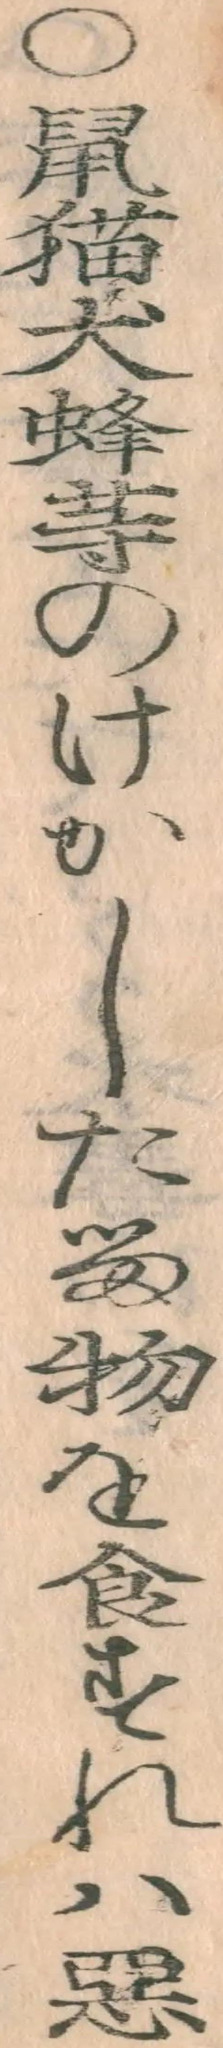〇鼠猫犬蜂等のけかしたる物を食すれは悪
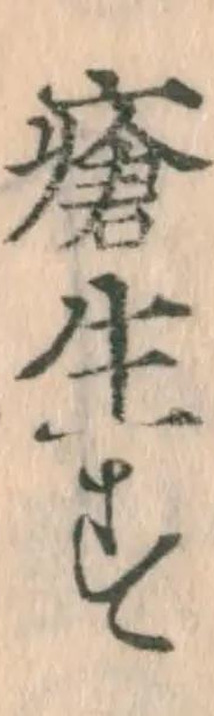瘡生す
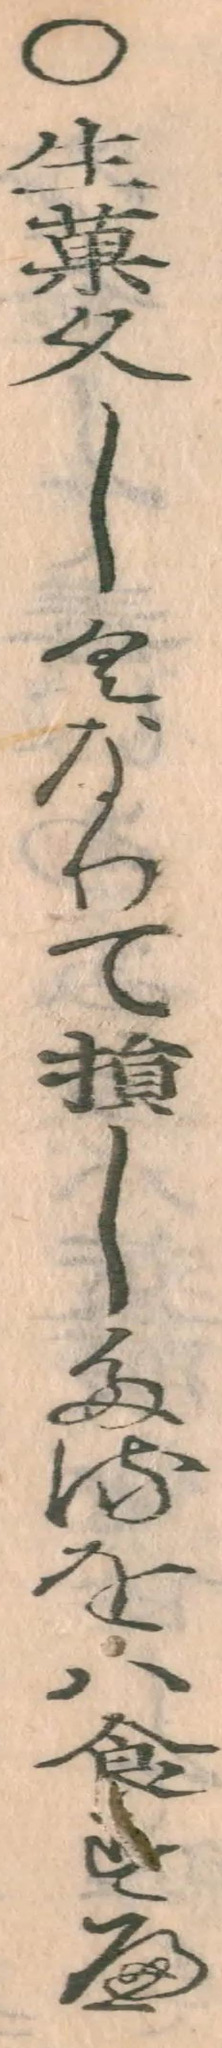〇生菓久しくなりて損したるをは食すへ
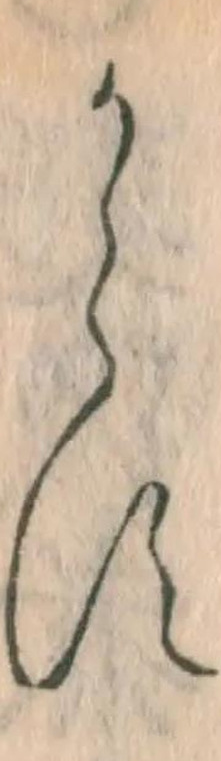からす
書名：延壽撮要
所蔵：国立国会図書館 National Diet Library, JAPAN
